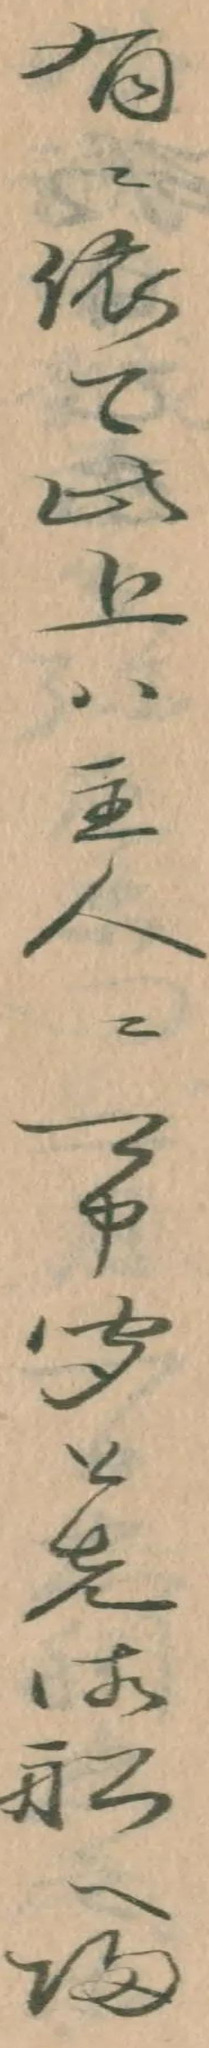有に依て此上は主人に可申聞と先御舩へ帰
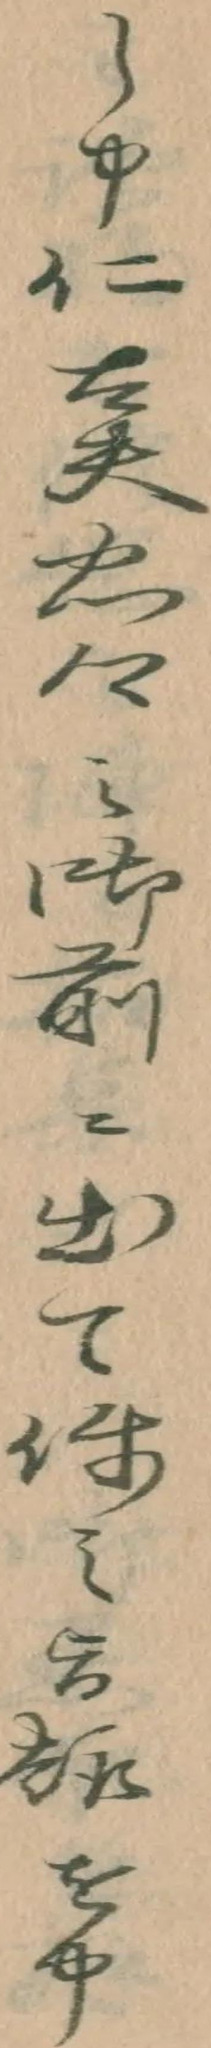し申仁太夫忠郷之御前に出て件之旨趣を申
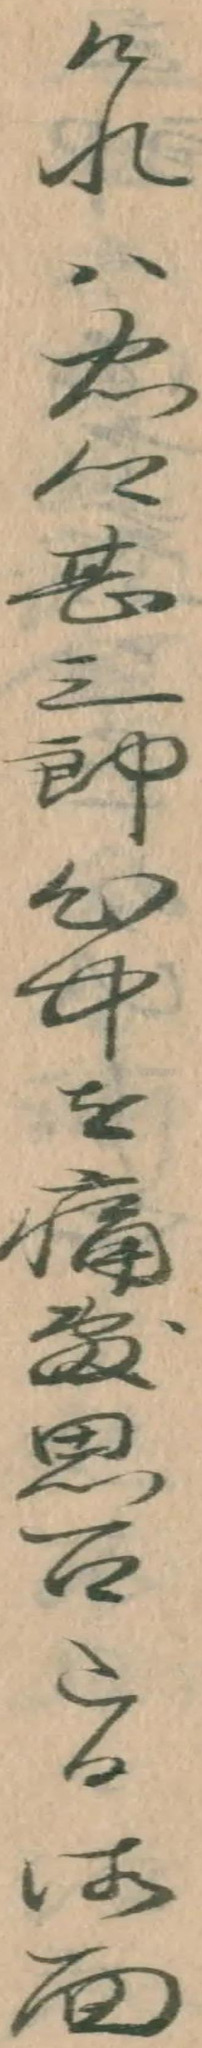けれは忠郷甚三郎心中を痛敷思召たる御面
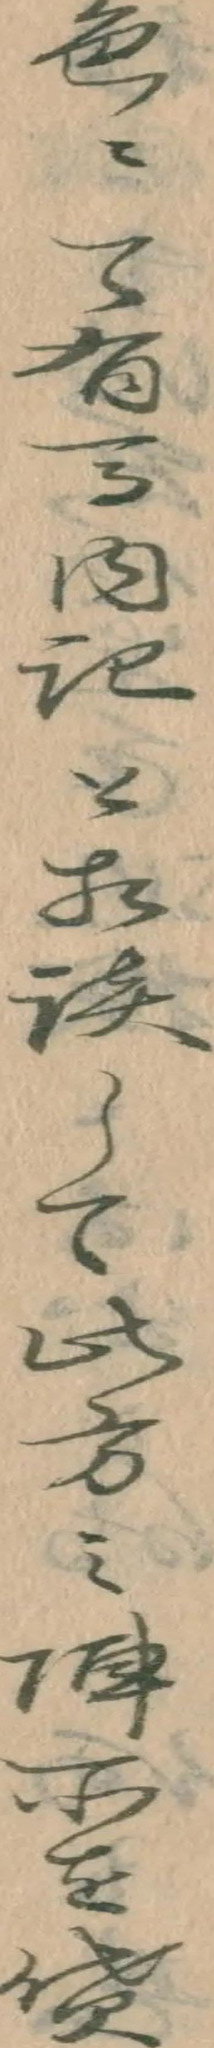色にて有馬内記と相談して此方之陣所を貸
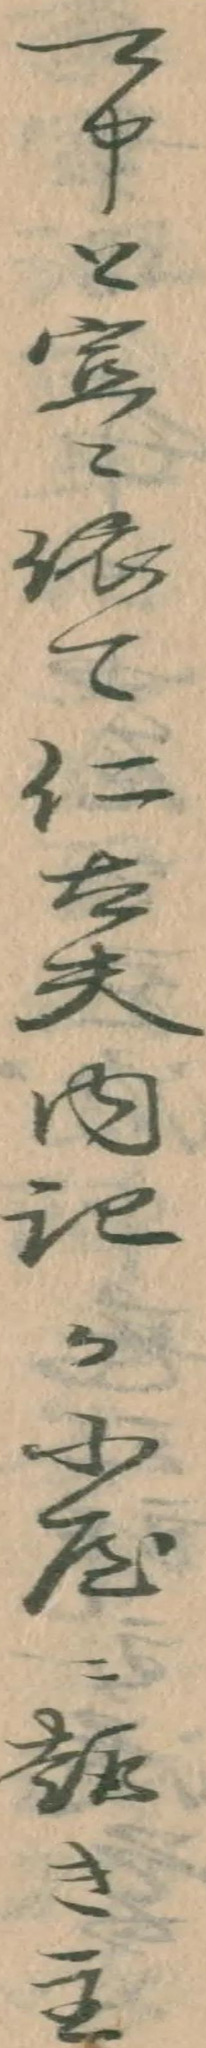可申と宣に依て仁太夫内記か小屋に趣き主
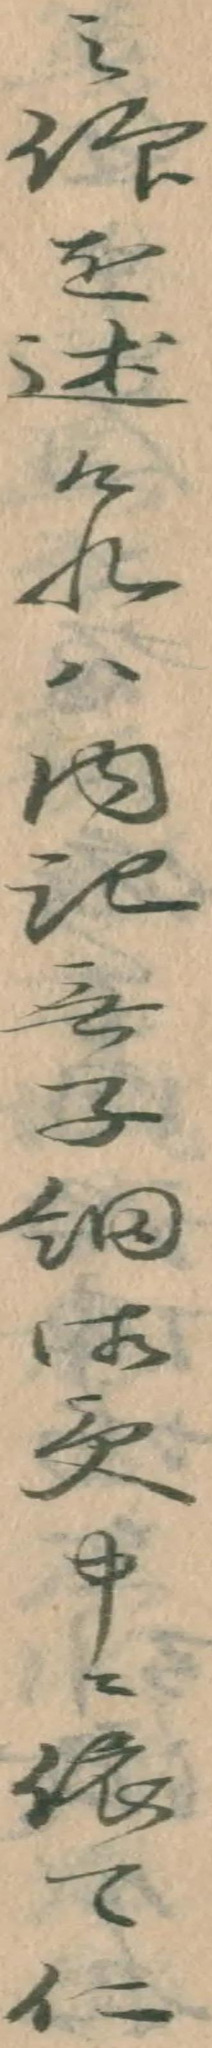之仰を述けれは内記無子細御受申に依て仁
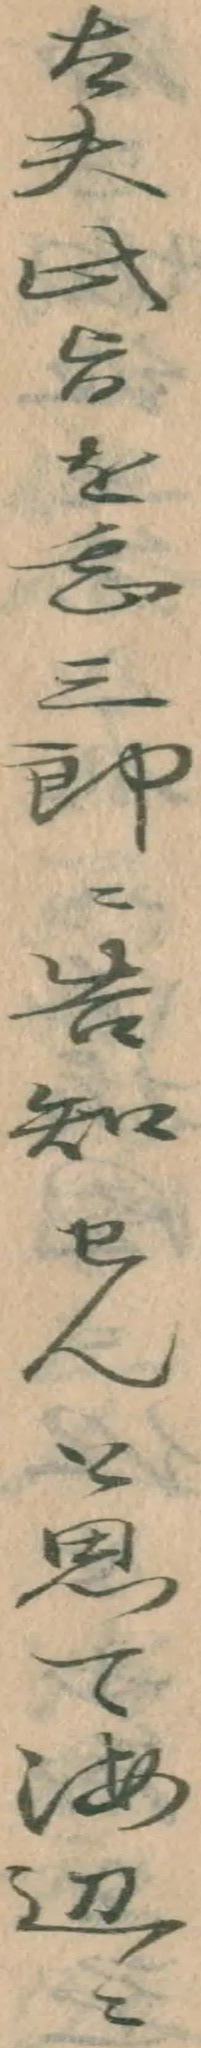太夫此旨を甚三郎に告知せんと思て海辺に
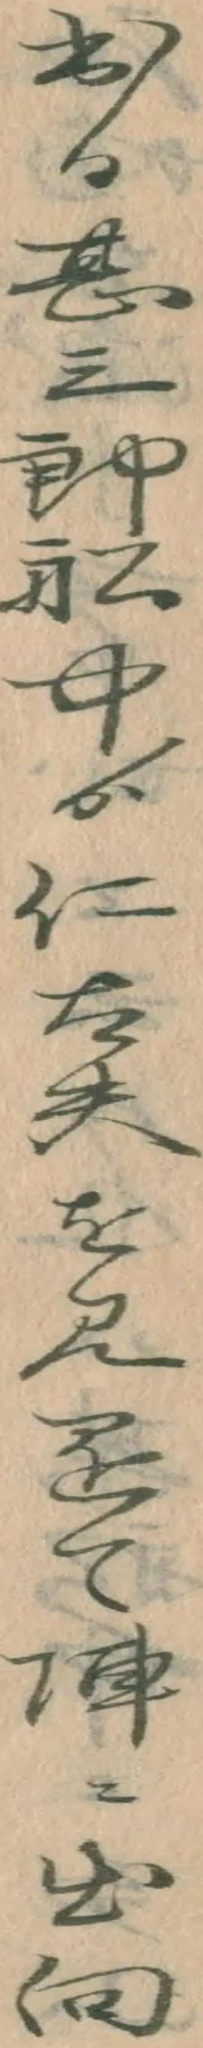出る甚三郎舩中ゟ仁太夫を見懸て陣に出向
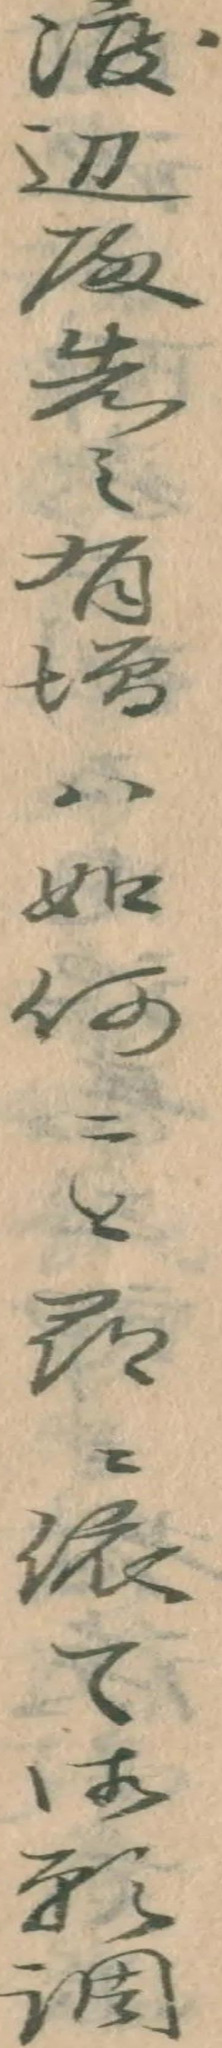渡辺殿先之有増は如何にと尋に依て御願調
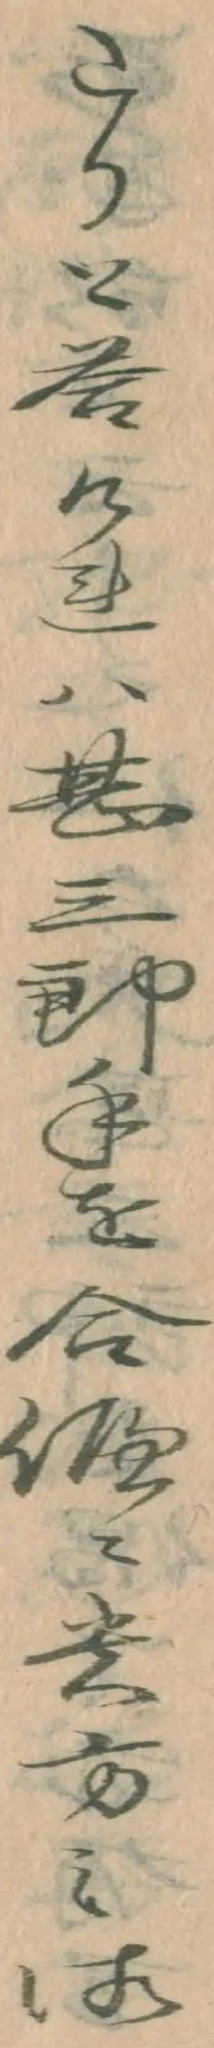たりと答け連は甚三郎手を合偏に貴方之御

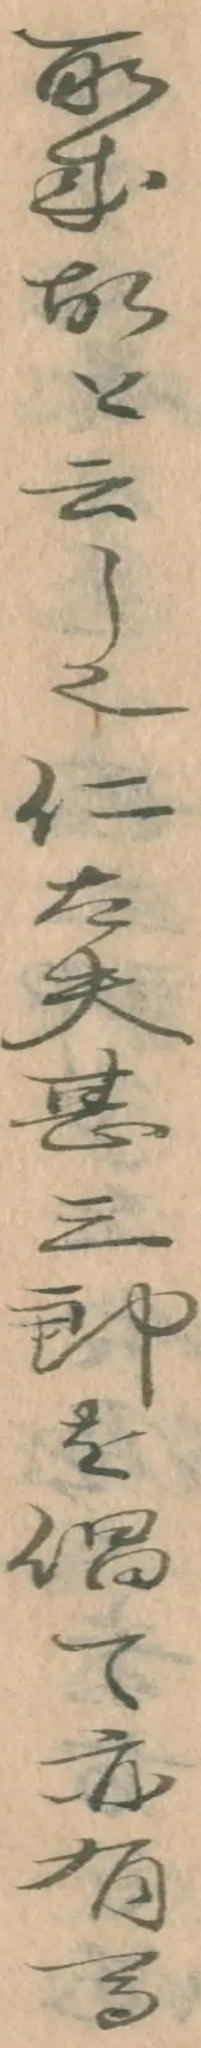取成故と云し也仁太夫甚三郎を偲て亦有馬
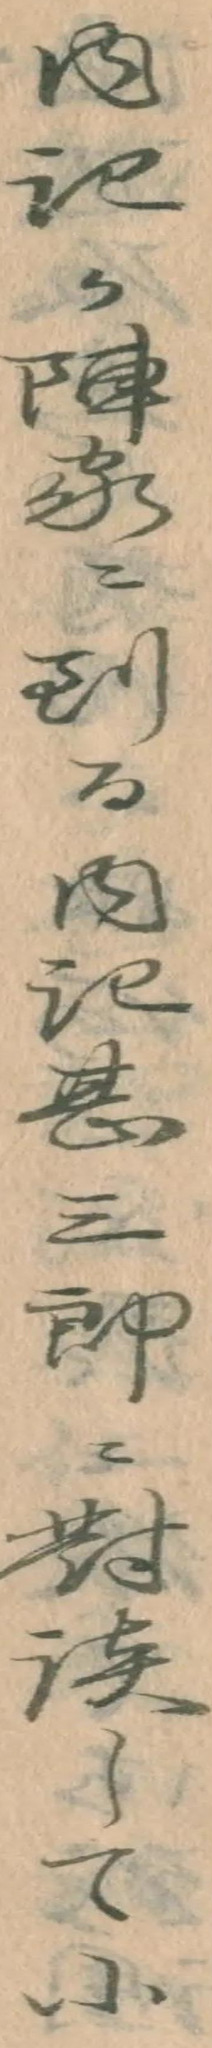内記か陣家に到る内記甚三郎に対談して小
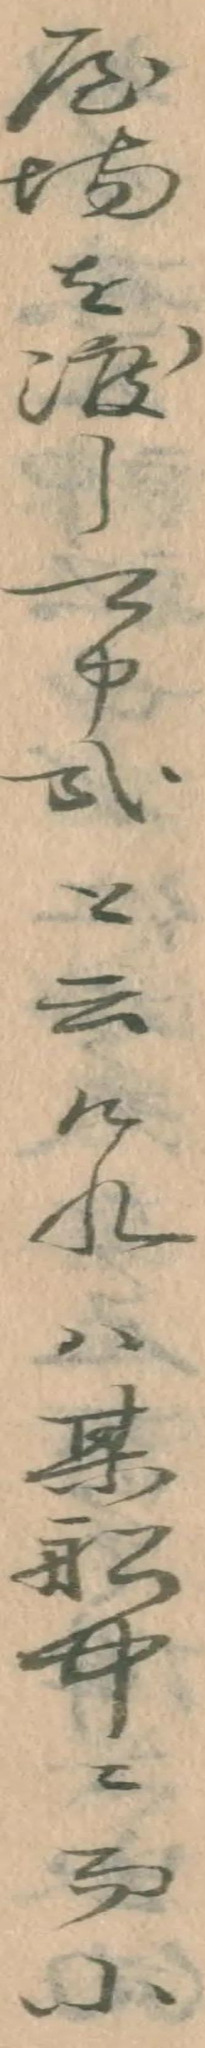屋場を渡し可申哉と云けれは某舩中に而小
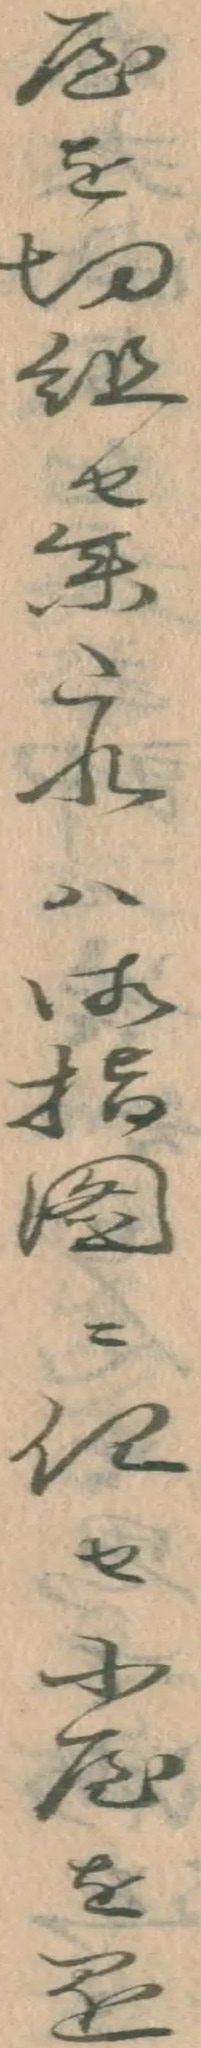屋を切組せ参たれは御指図に任せ小屋を懸
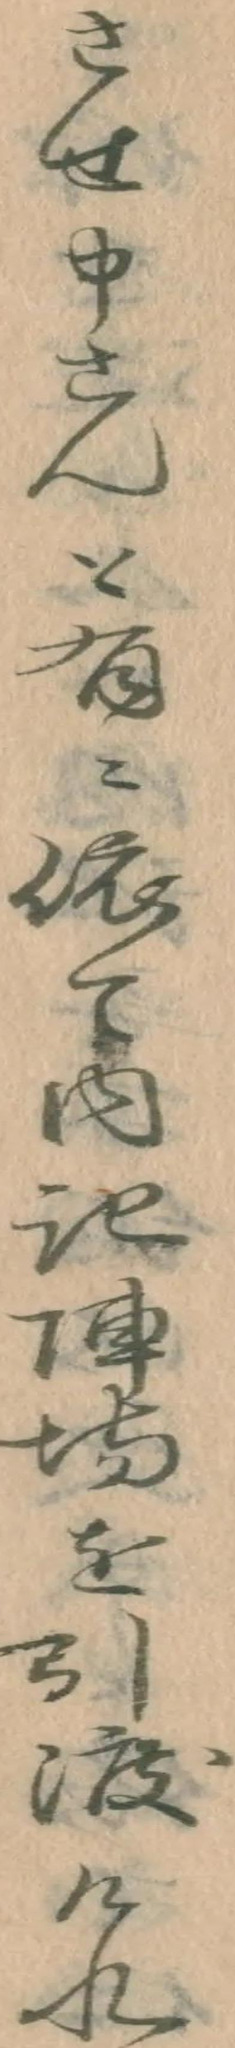させ申さんと有に依て内記陣場を引渡けれ
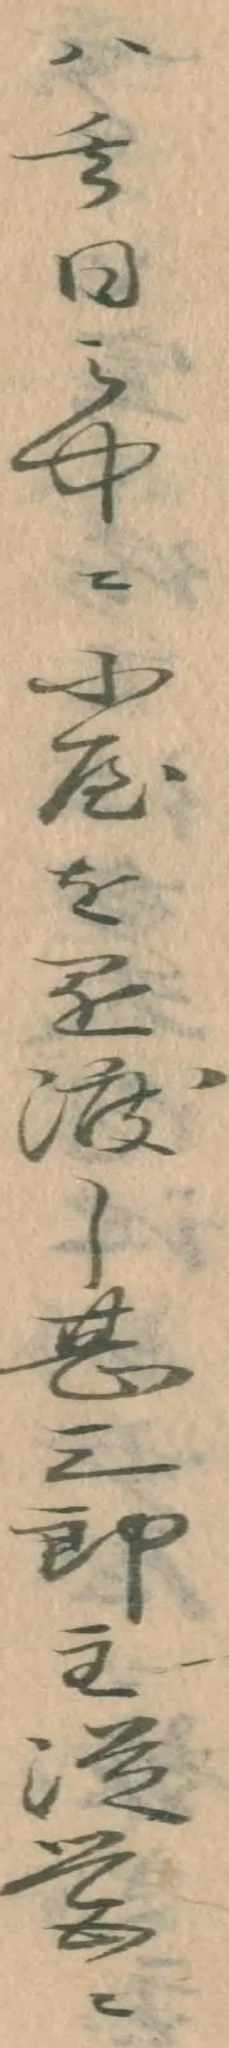は其日之中に小屋を懸渡し甚三郎主従営に
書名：切支丹御退治記 49巻. [6]
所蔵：国立国会図書館 National Diet Library, JAPAN
